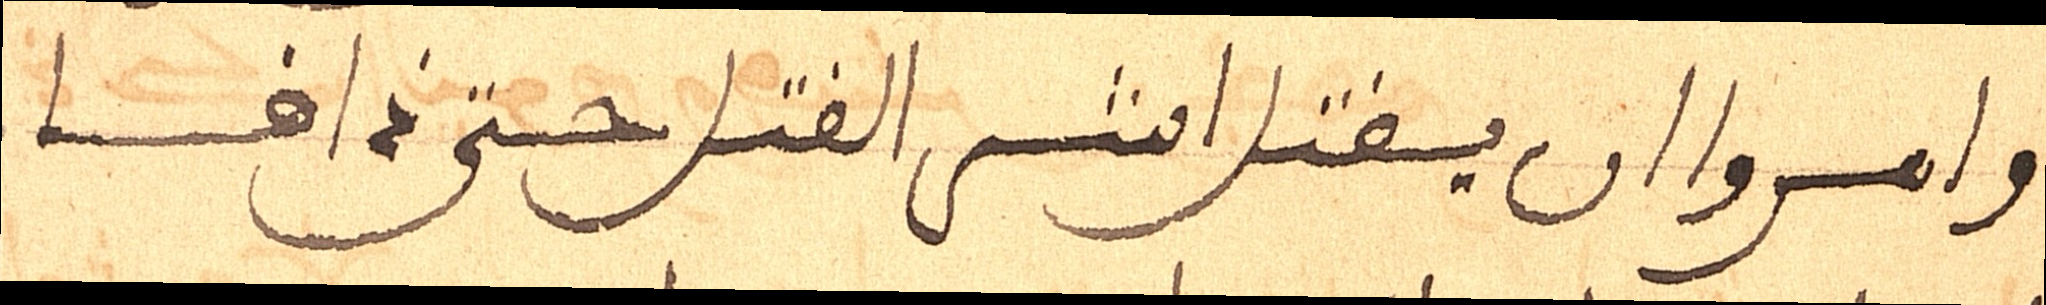وامروا ان يقتل اشر القتل حتى ذاقا
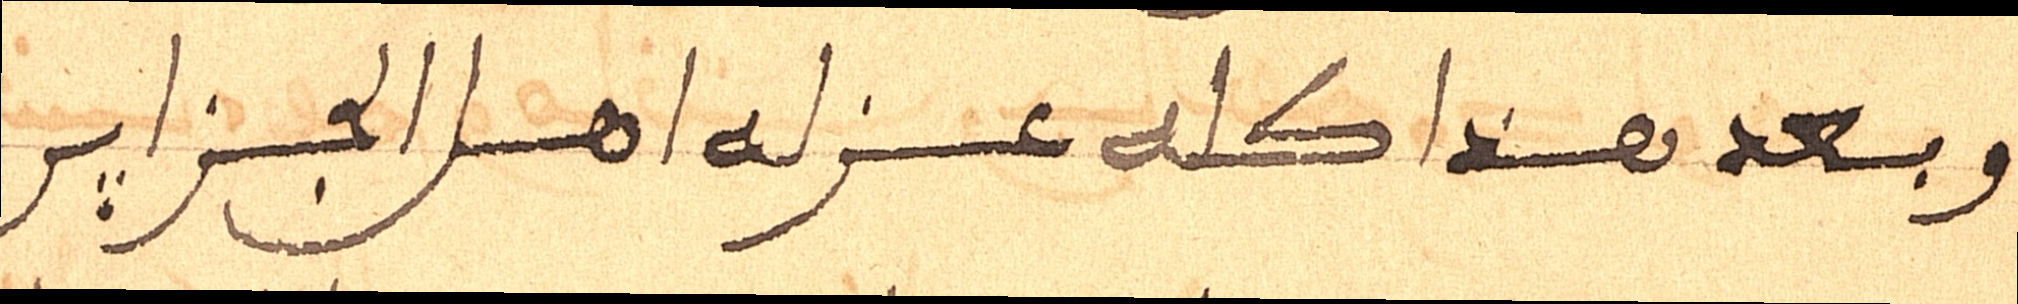وبعد هذا كله عزله اهل الجزائر
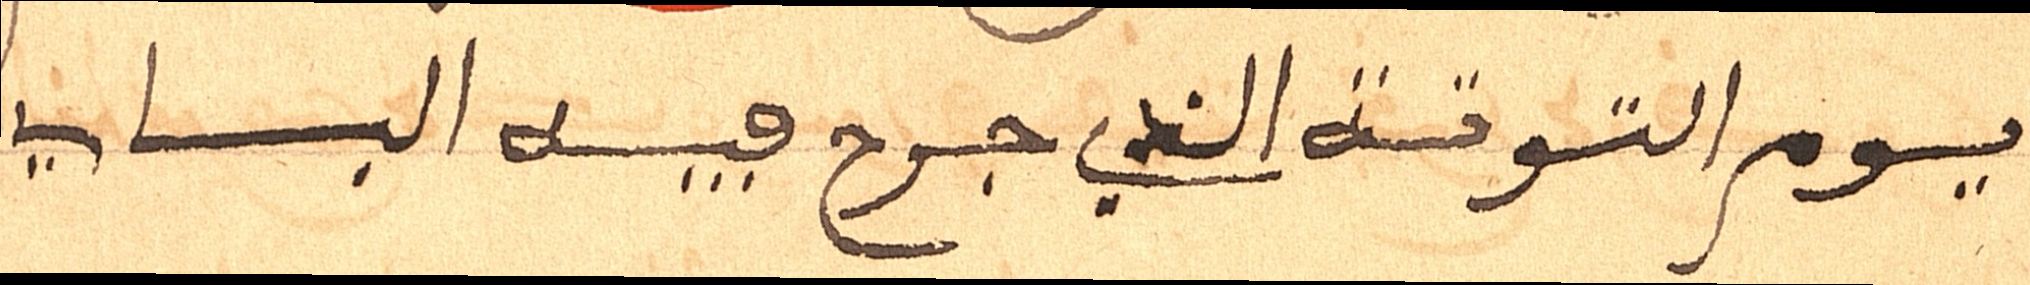يوم التوتة الذي جرح فيه الباي
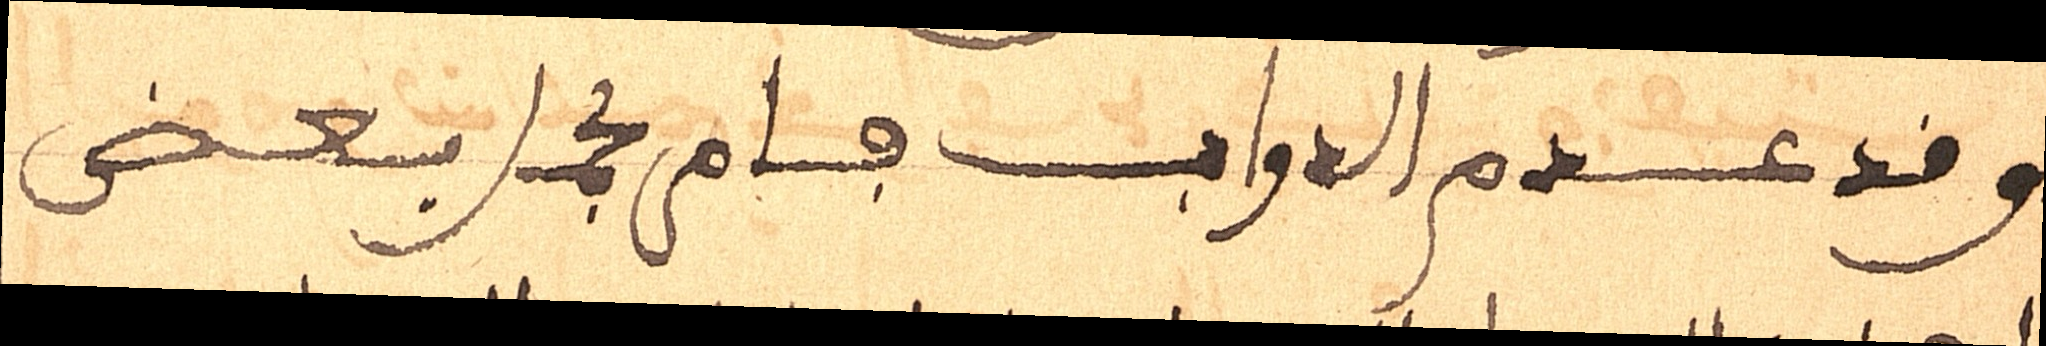وقد عدم الدواب فامر بمحمد بعض
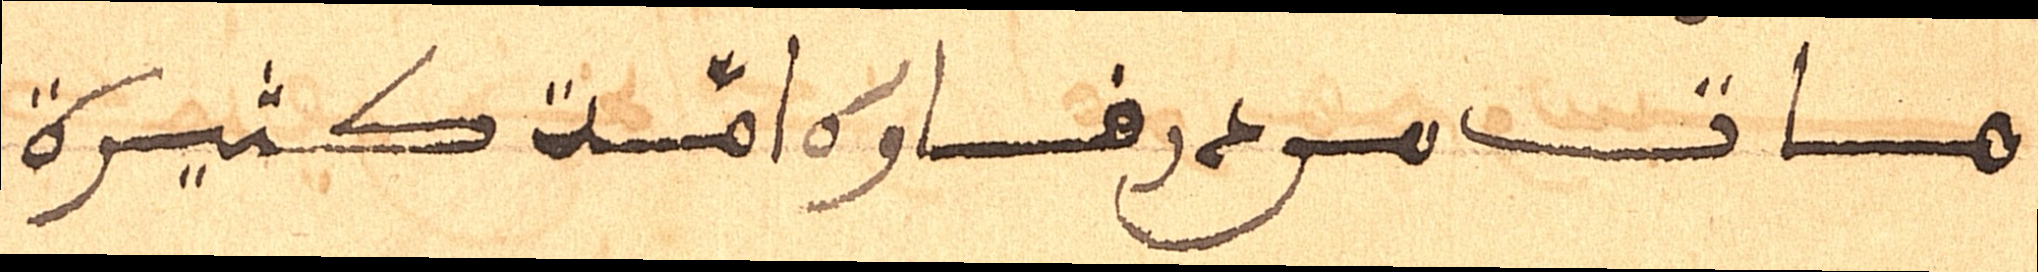مات من درقاوه امة كثيرة
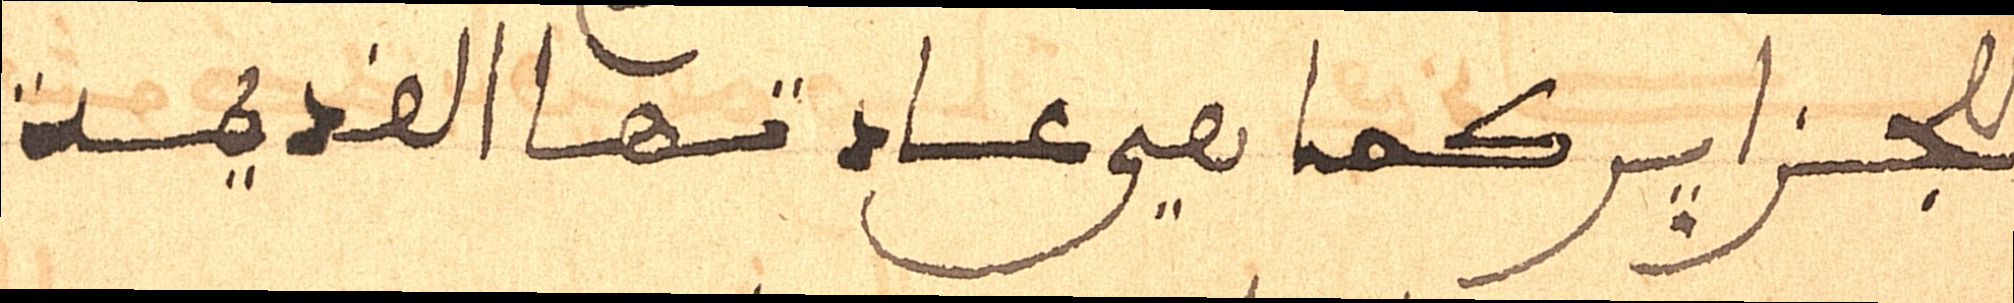للجزائر كما هي عادتها القديمة
